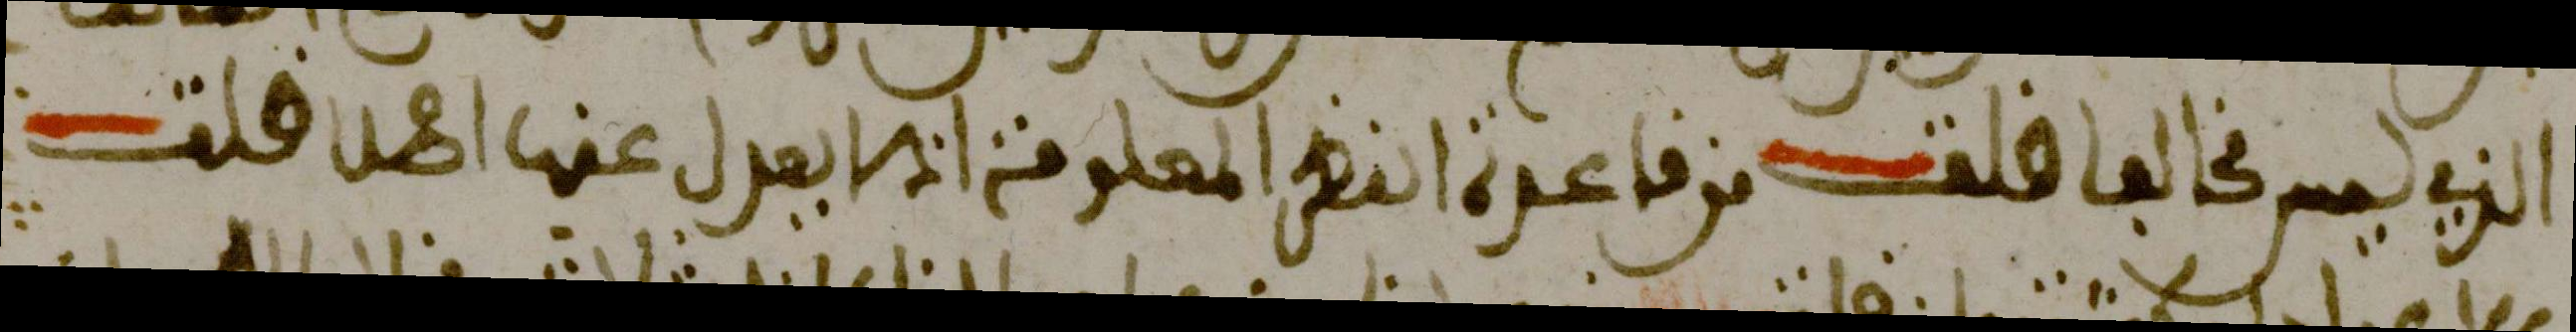الذي ليس مخالفا قلتَ من قاعدة النظر المعلومة اذ لا يعدل عنها اصلا قلتَ
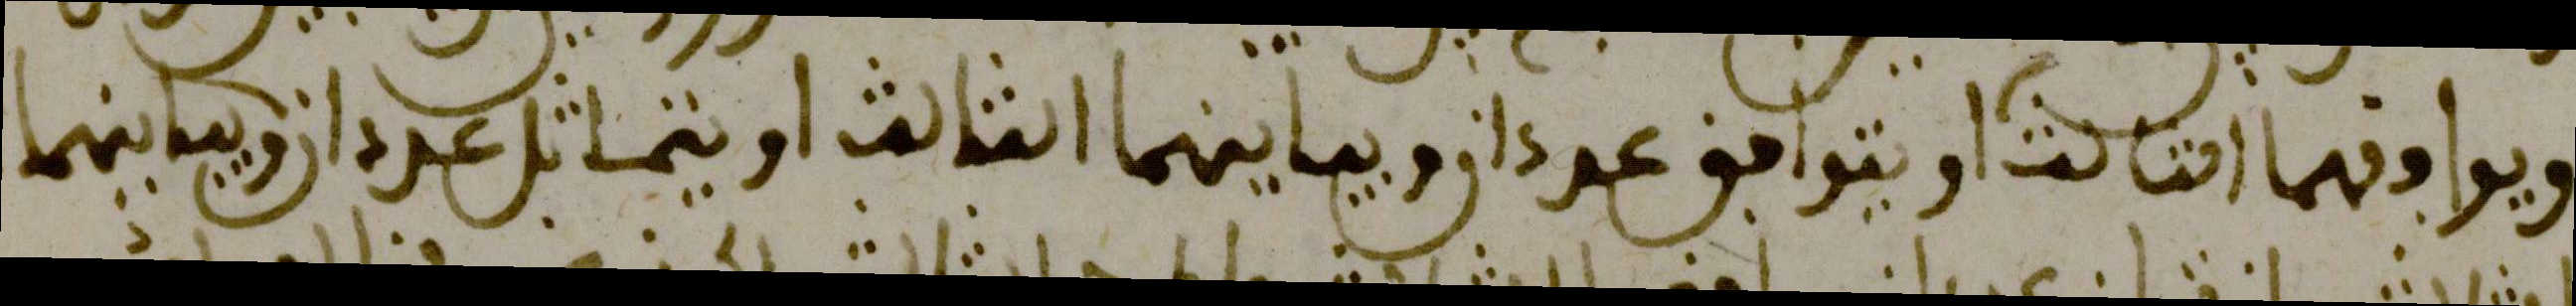ويوافقهما الثالث او يتوافق عددان ويباينهما الثالث او يتماثل عددان ويباينهما
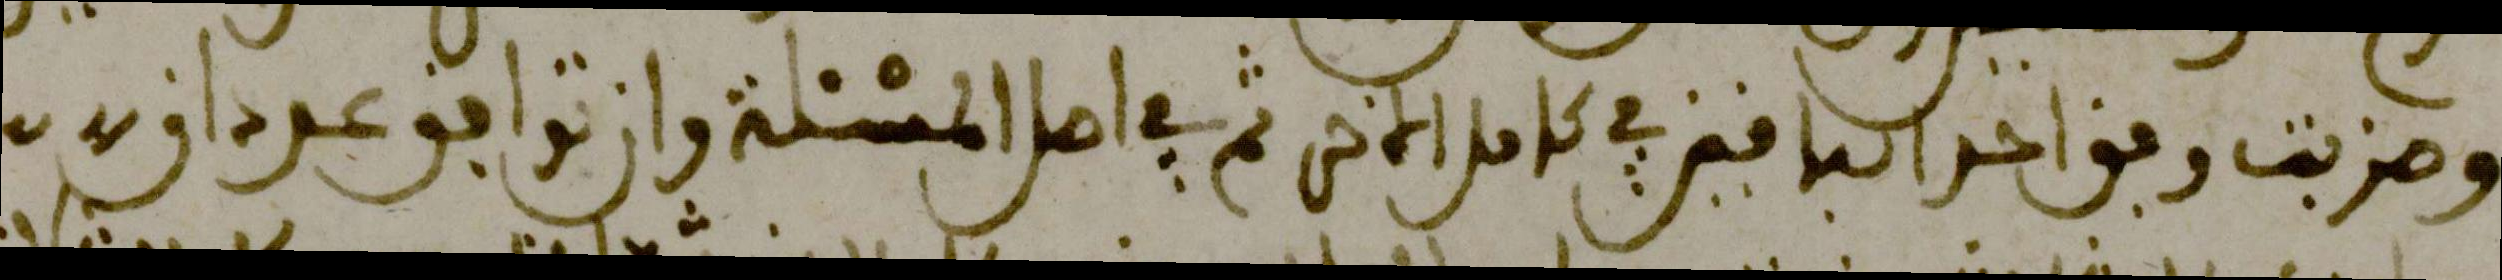وضربت وفق احد الباقين في كامل الاخر ثم في اصل المسْئلة وان توافق عددان
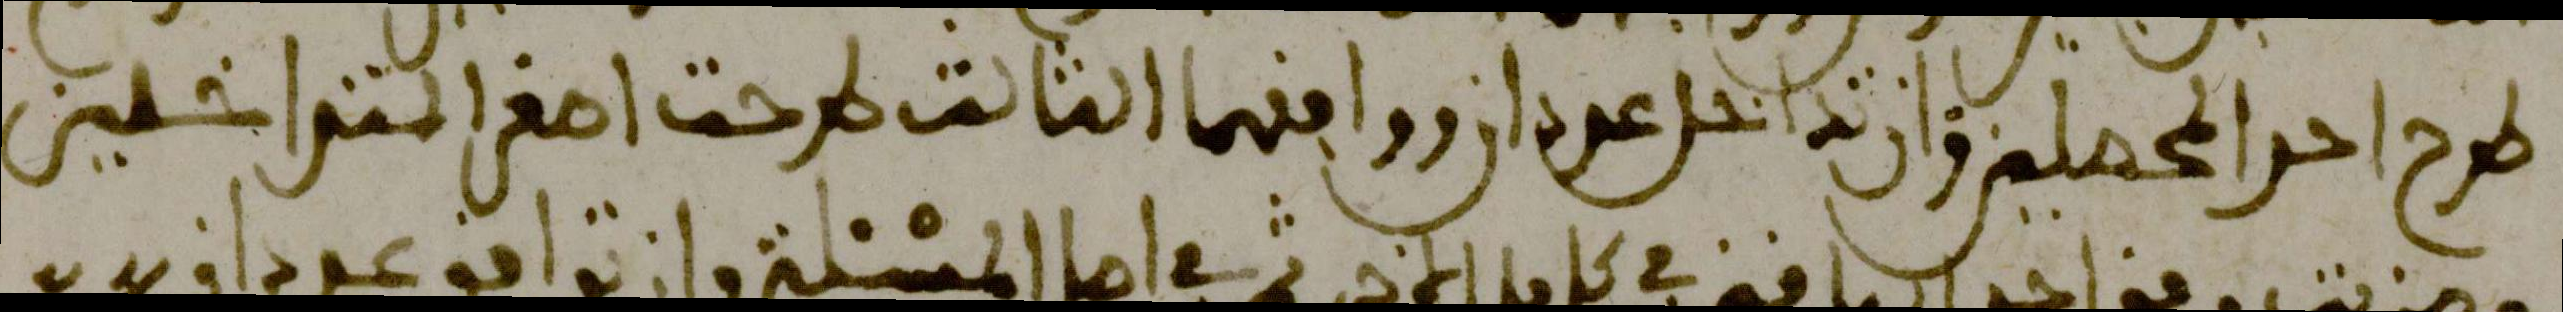طرح احد المحصلين وَان تداخل عددان ووافقهما الثالث طرحت اصغر المتداخلين
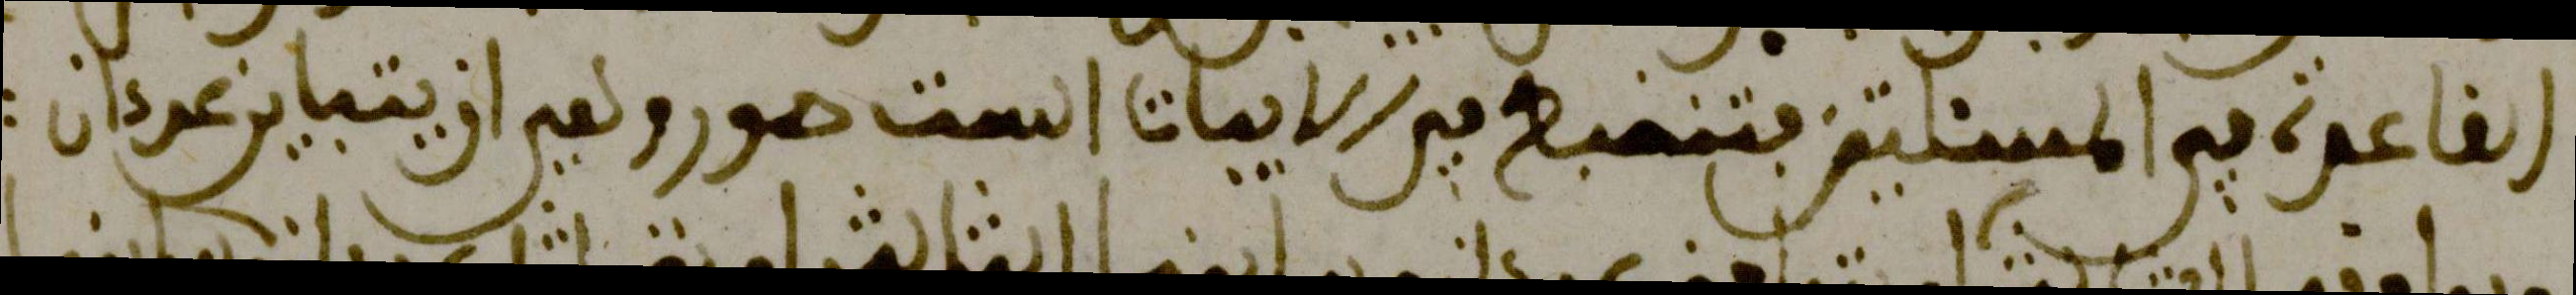القاعدة في المسئلتين فتنضبط في الابيات الست صور وهي ان يتباين عددان
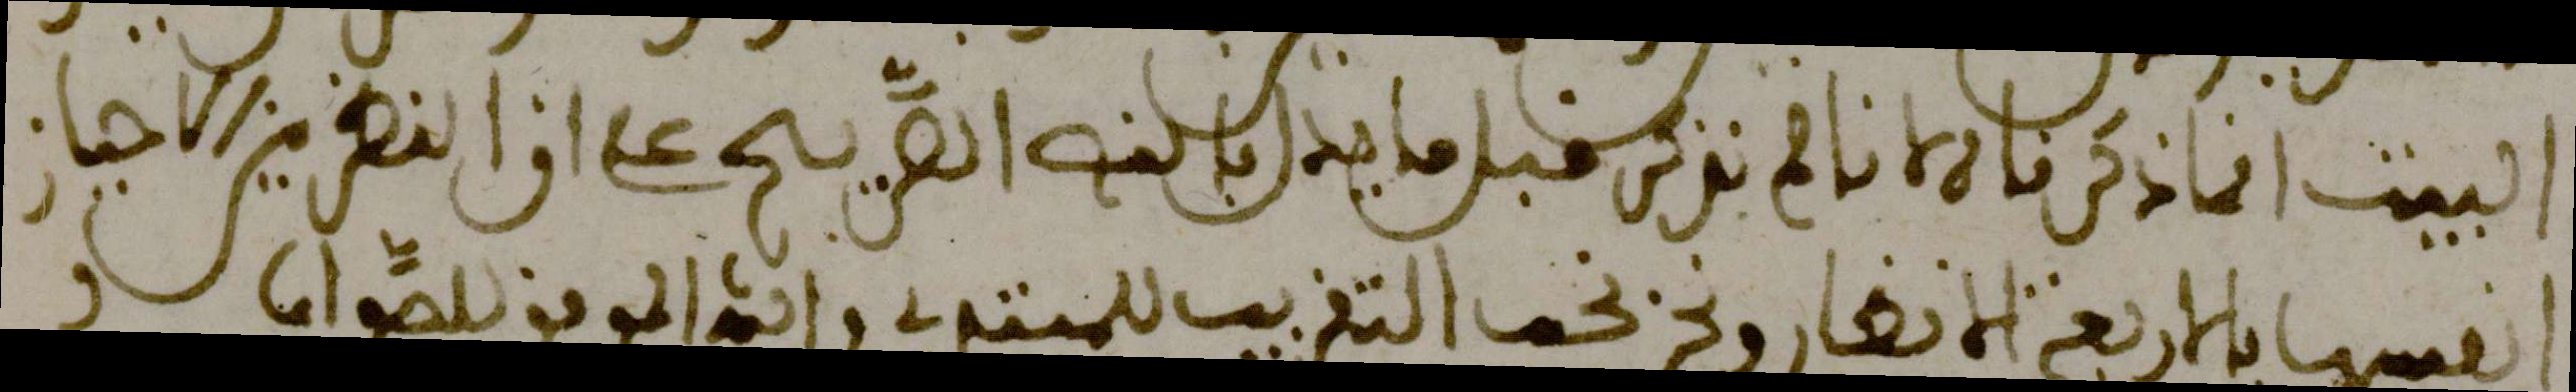البيت انما ذكرناه لا نالم نذكر قبل ما يدل بالنص الصَّريح على ان النظرين الاحياز
